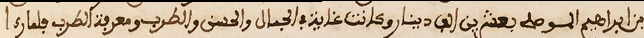بن ابراهيم الموصلى بعشرين الف دينار وكانت غاية في الجمال والحسن والطرب ومعرفة الطرب فلما رءا
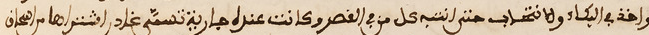واخذ في البكاء ولانتحاب حتى انتبه كل من في القصر وكانت عنده جارية تسمّى غادر اشتراها من اسحاق
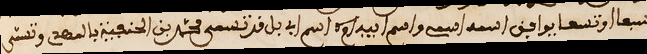سبعا او تسعا يوافق اسمه اسمى واسم ابيه امه اسم ابى بل قد تسمى محمّد بن الحنفية بالمهدى وتسمّى
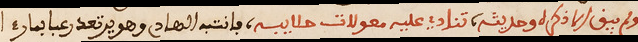ولم يبق الا ذكره وحديثه تنادي عليه معولات حلايبه فانتبه الهادى وهو يرتعد رعبا بما رءا
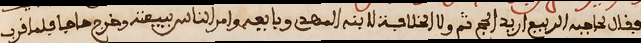فقال لحاجبه الربيع اريد الحج ثم ولا الخلافة لابنه المهدى وبايعه وامر الناس بيعته وخرج حاجا فلما قرب
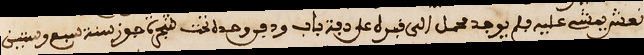نعش يمشى عليه فلم بوجد فحمل الى قبره على دفة باب ودفن وحده تحت شجرة جوز سنة سبع وستين
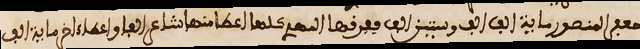جعفر المنصور ماية الف الف ستين الف ففرقها المهدى كلها اعطا منها شاعر الفا واعطا ءاخر ماية الف
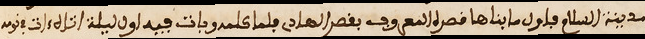مدينة السلام فاول ما بناها قصره المعروف بقصر الهادى فلما كلمه وبات فيه اول ليلة اتاه ءات في نومه
